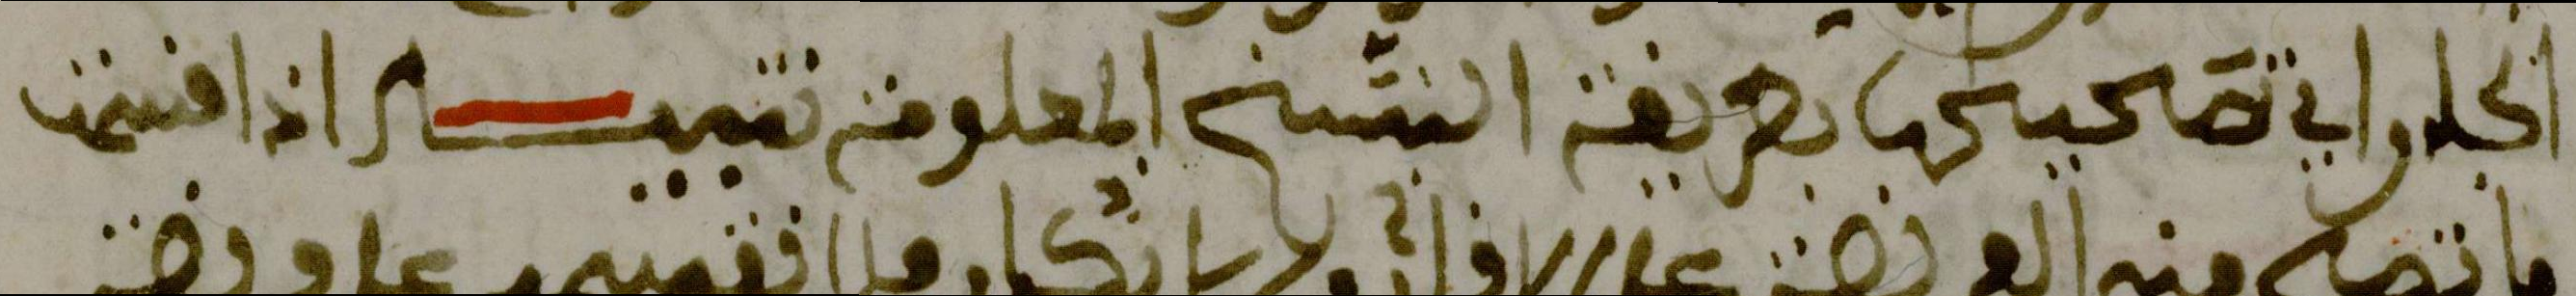الجاراي تصحيحها بطريقة النسخ المعلومة تنبيه اذا اقسمت
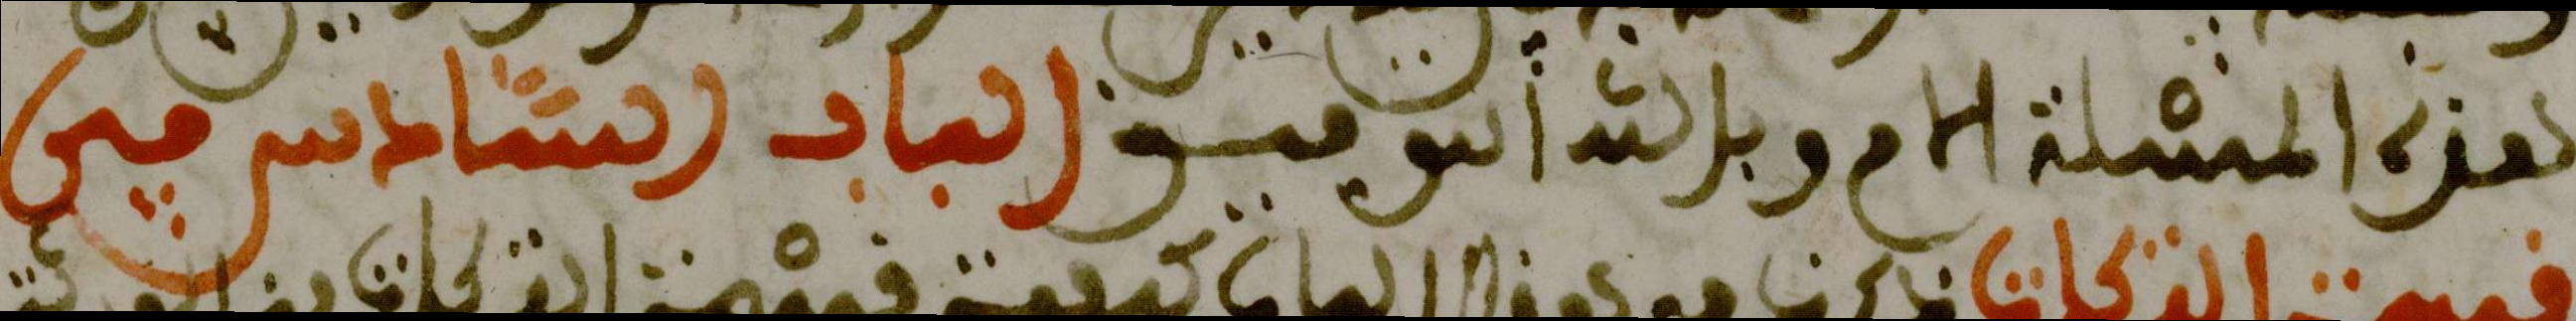هذه المسْلة الام وبالله التوفيق الباب السَّادس في
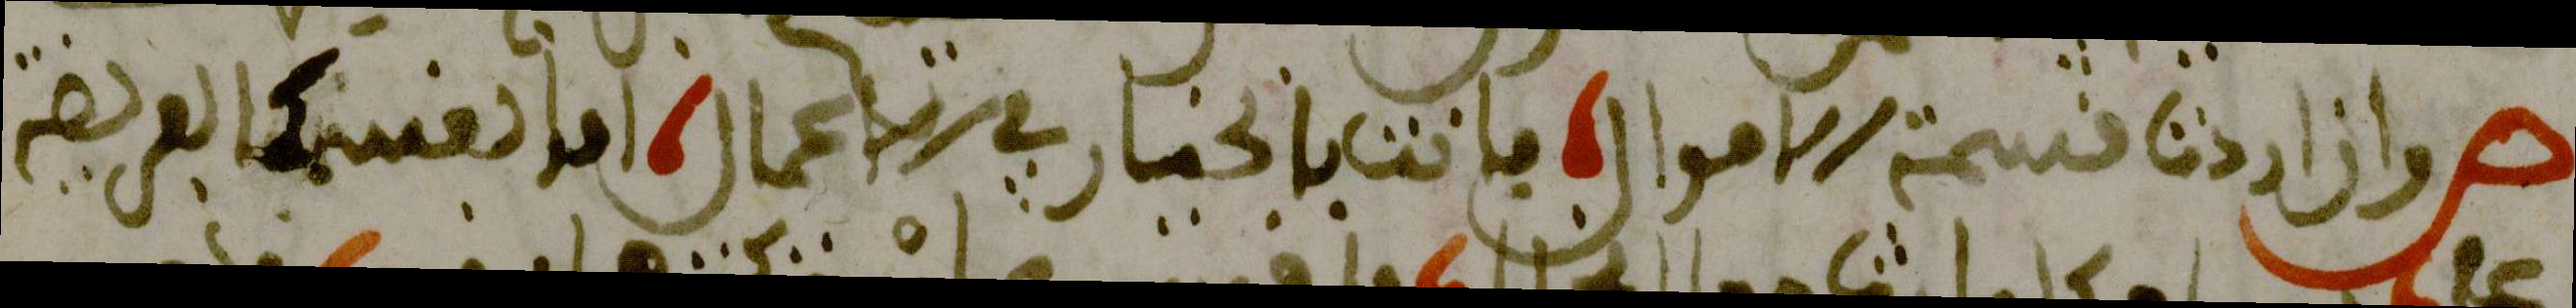ص وان اردت قسمة الاموال فانت بالخيار في الاعمال اما بقسمك الفريضة
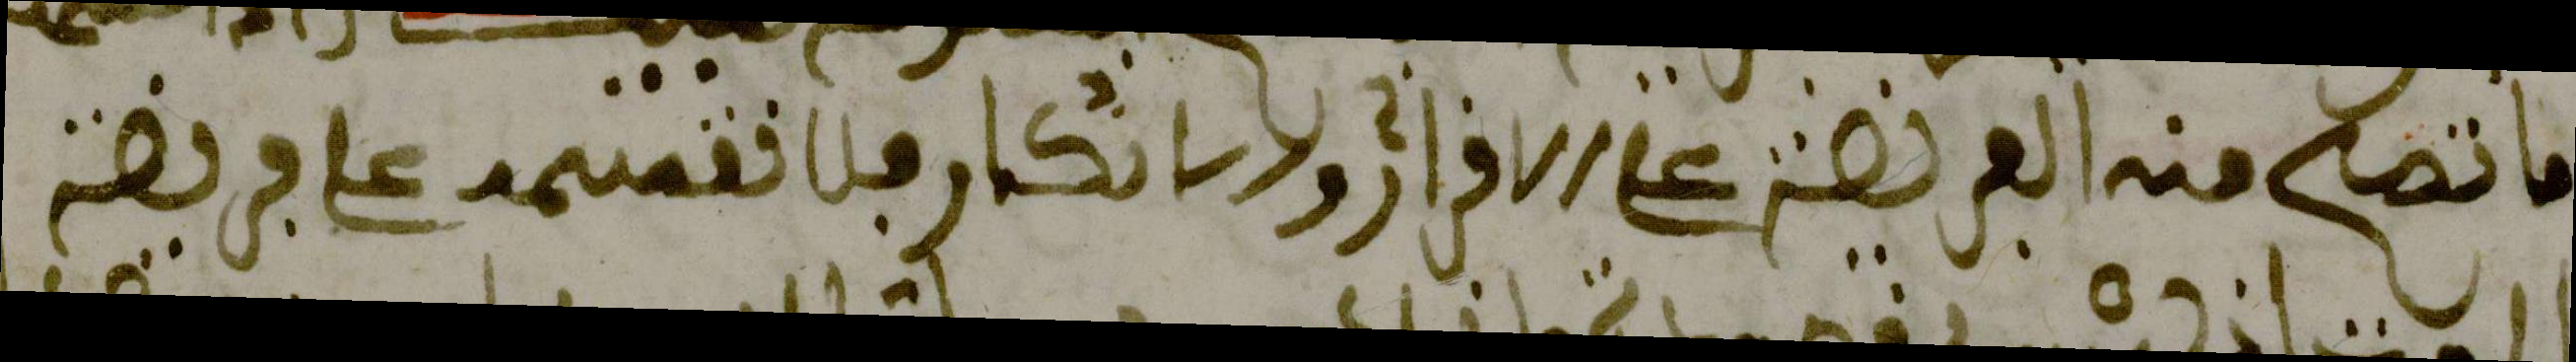ما تصح منه الفريضة على الاقرار والانكار فلا تقسمه على فريضة
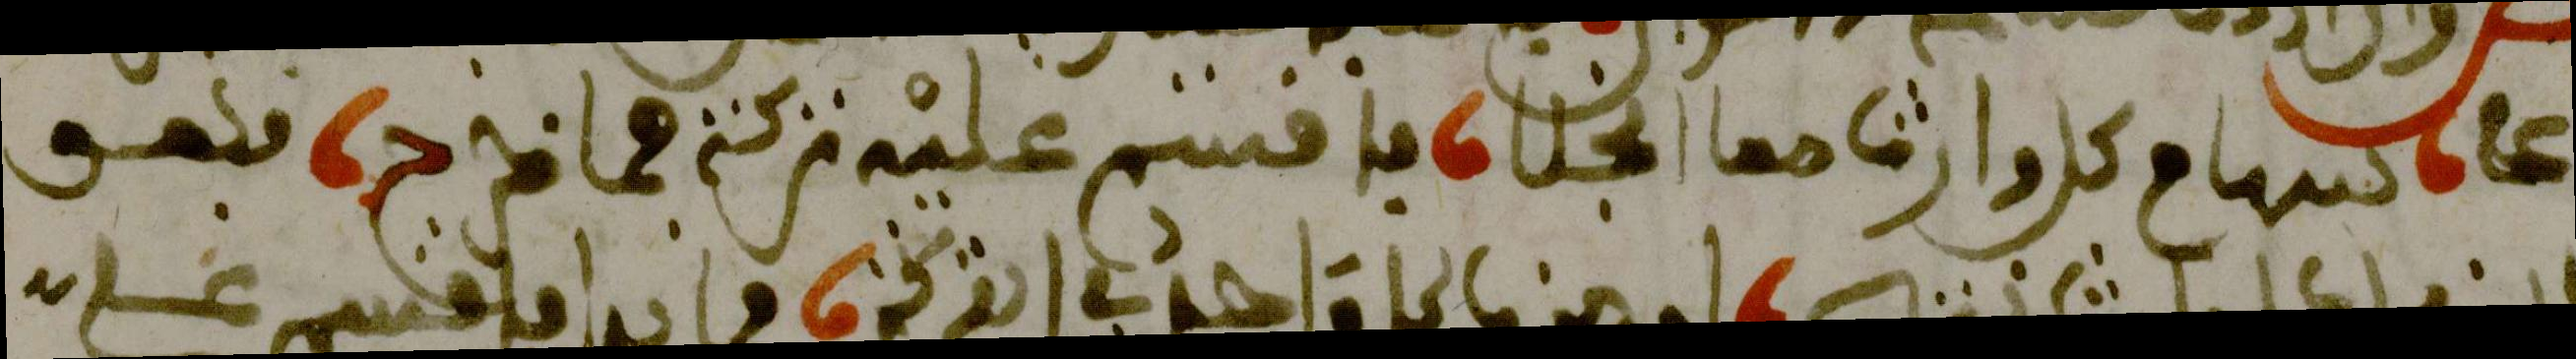على سهام كل وارث بها انجلا فاقسم عليْه تركة فما خرج فهو
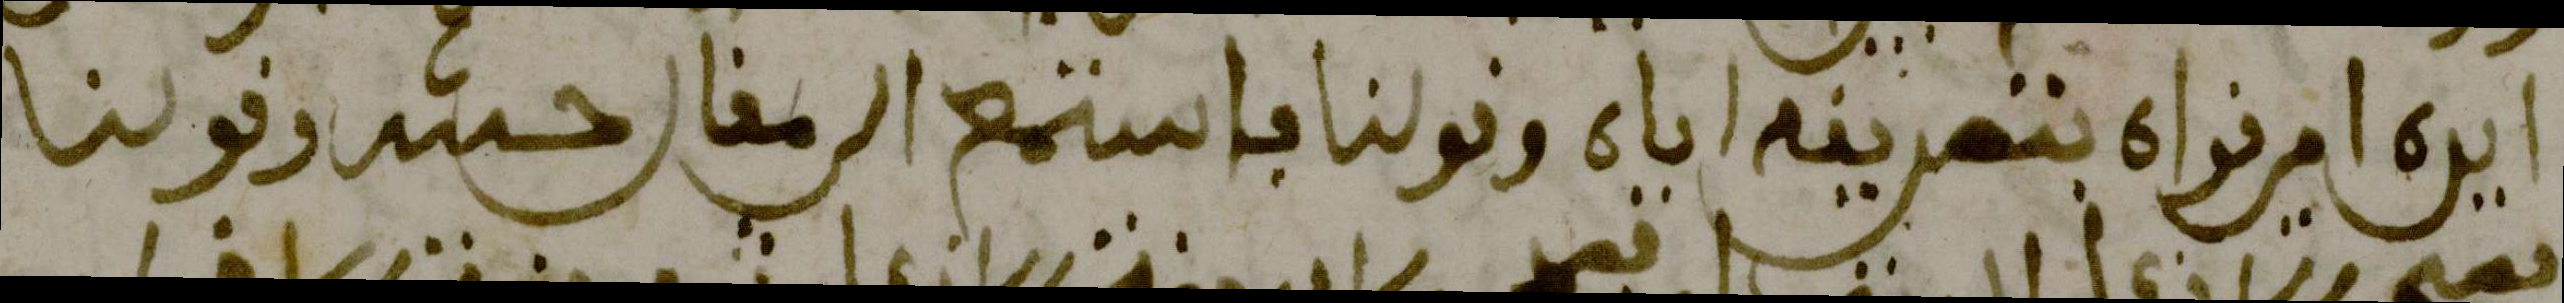ايده اي قواه بتصديقه اياه وقولنا فاستمع الى مقال حش وقولنا
